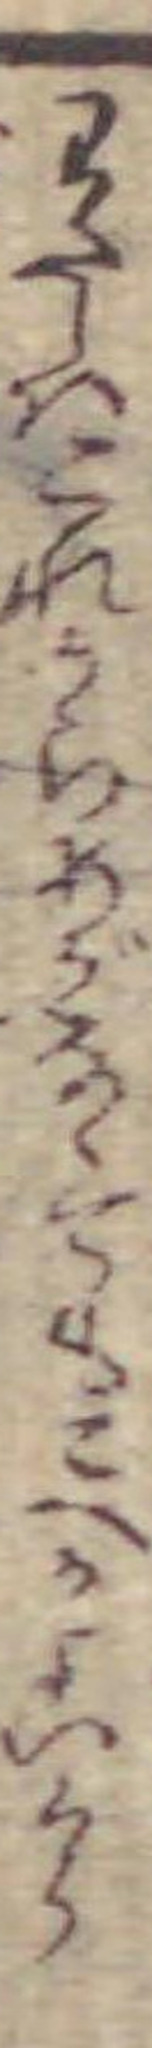わたしはこれからめがなくてもこへかよいから
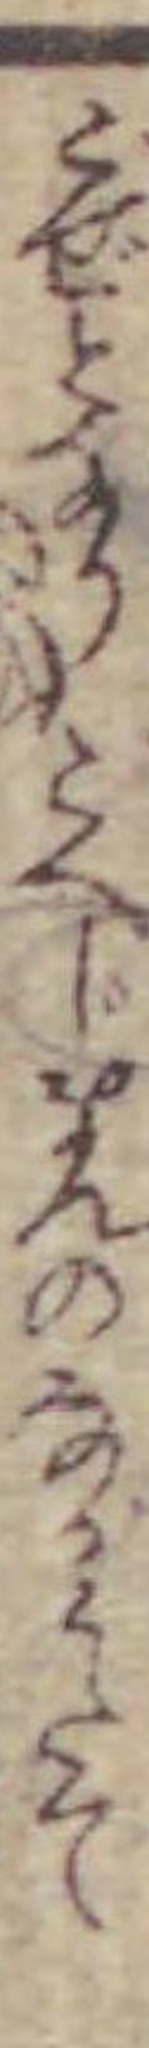ごぜとなりこへじまんのながうたて
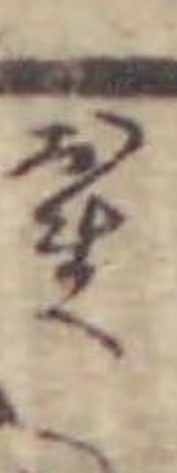おまへ
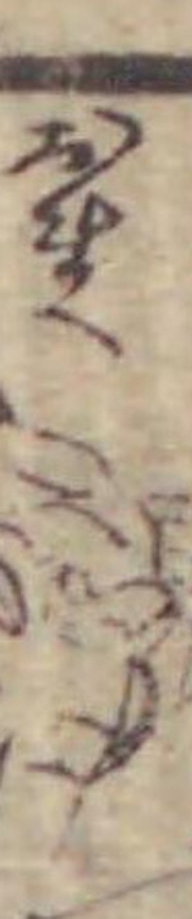おまへ
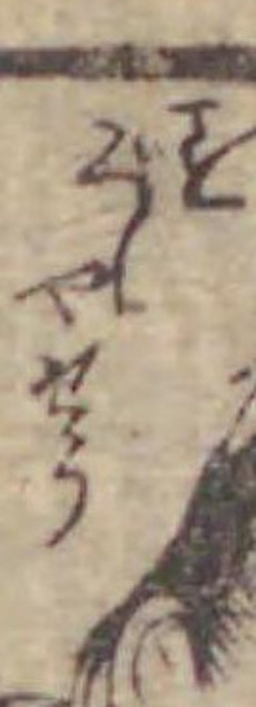ぐしやせう
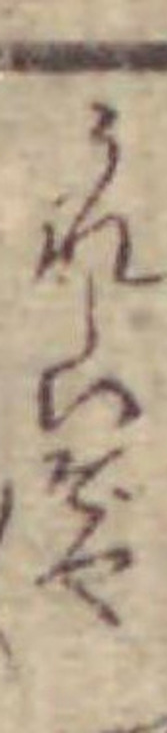うれしいぞや〱
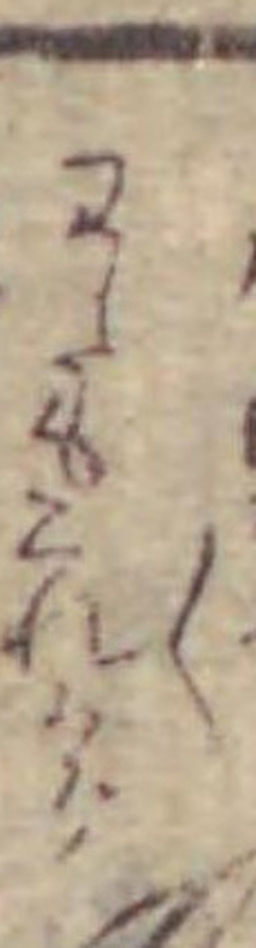わしもこれから
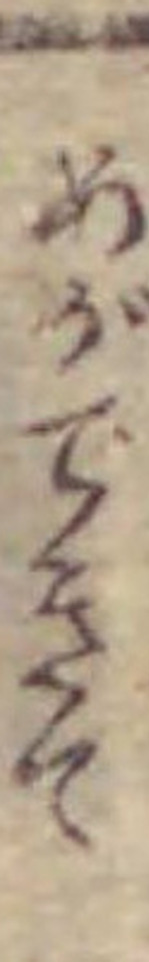めができて
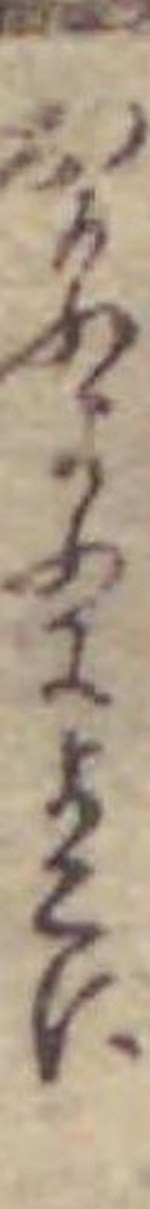おもふよふによこに
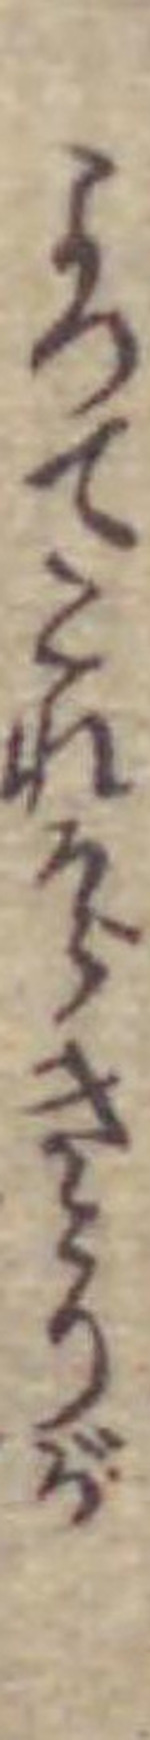よつてこれからきとりが
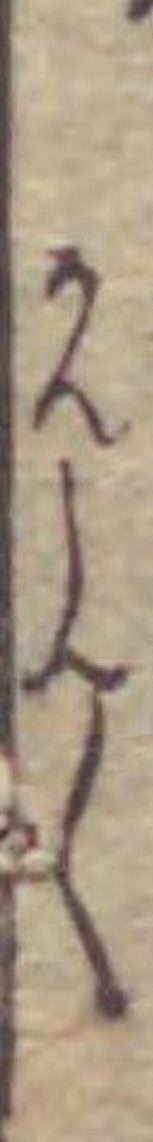かんしん〱
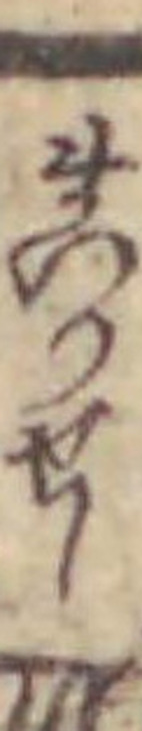まいりせし
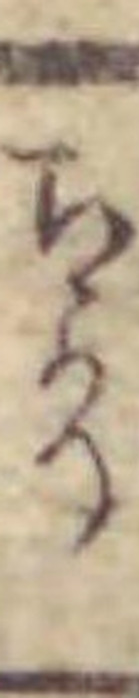ちより
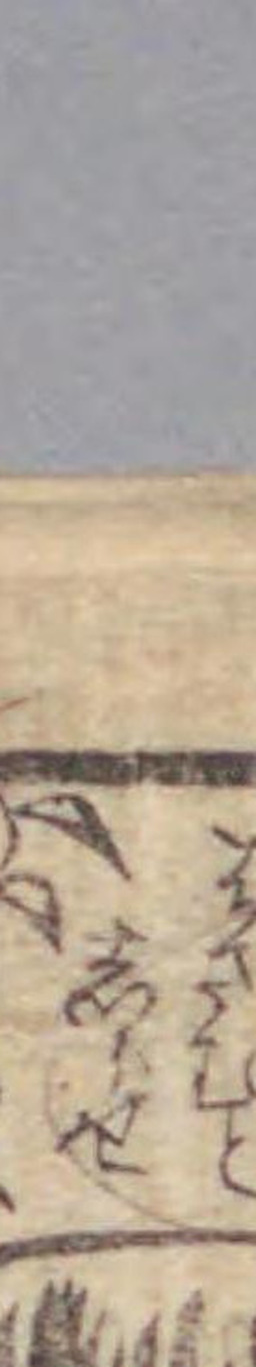しらせ
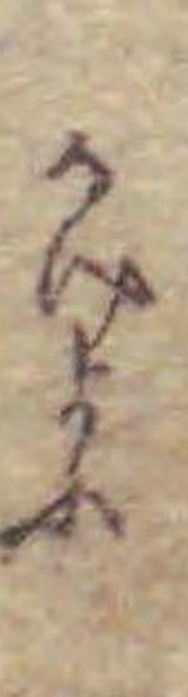かけよふ

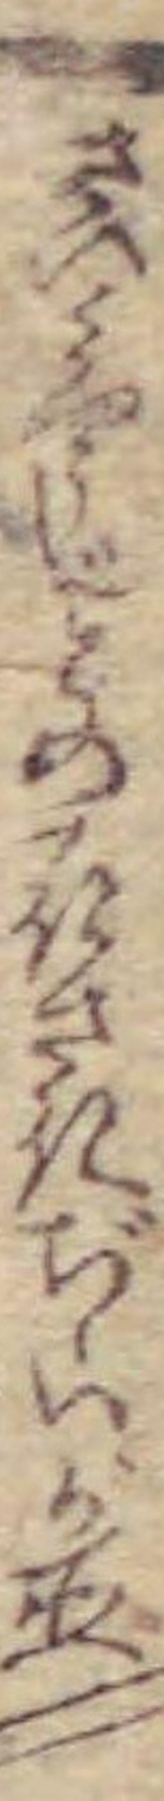さいきやうじとの花さきぢゝいが所へ
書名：交古勢昔咄 : 2巻
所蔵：国立国会図書館 National Diet Library, JAPAN
